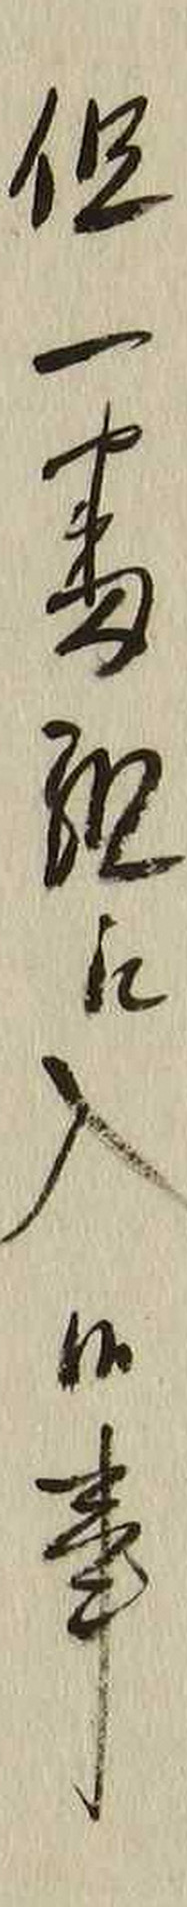但番一組江入候事
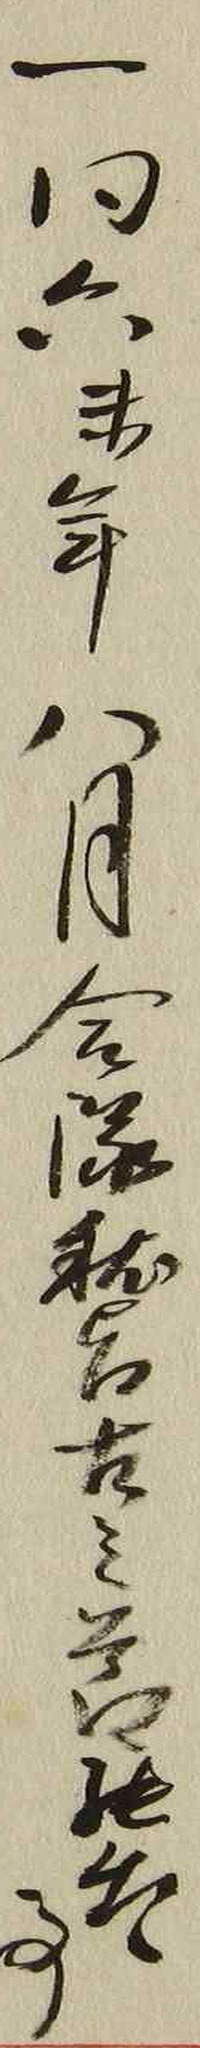一同六未年八月合隊稽古之節罷出候事
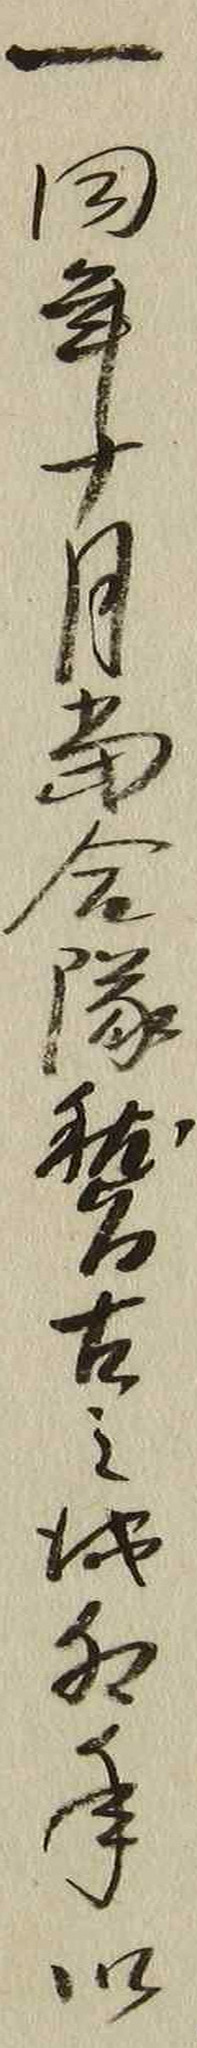一同年十月当合隊稽古之儀卯年以
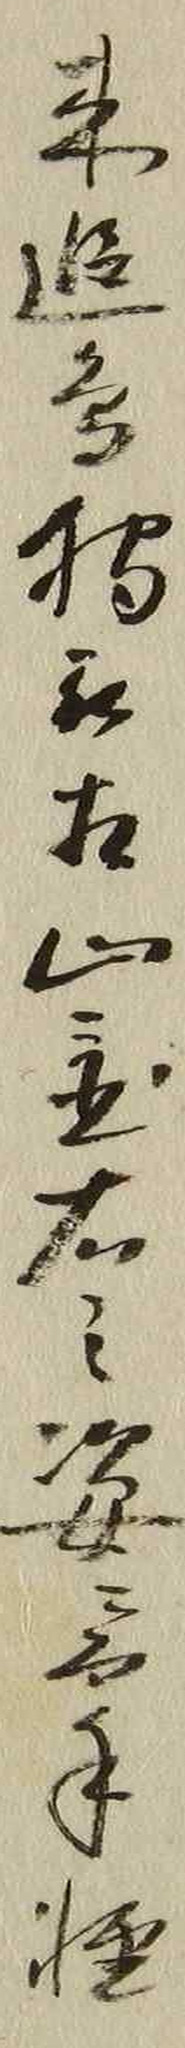来追鳥狩被相止置右之姿ニ而手軽
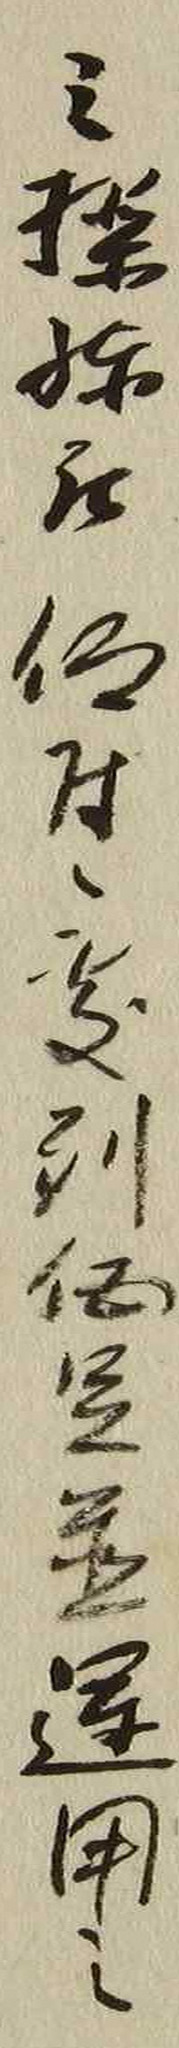之操練被仰付候処列伍足並運用之
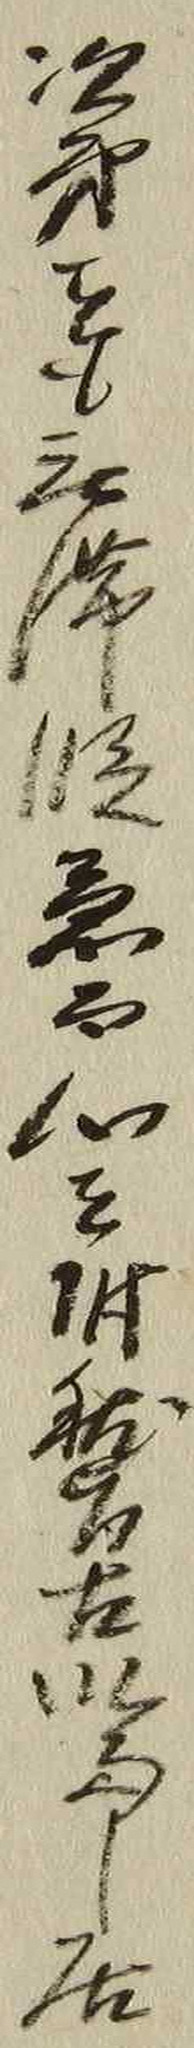次第をも無滞段兼而心を附稽古いたし居
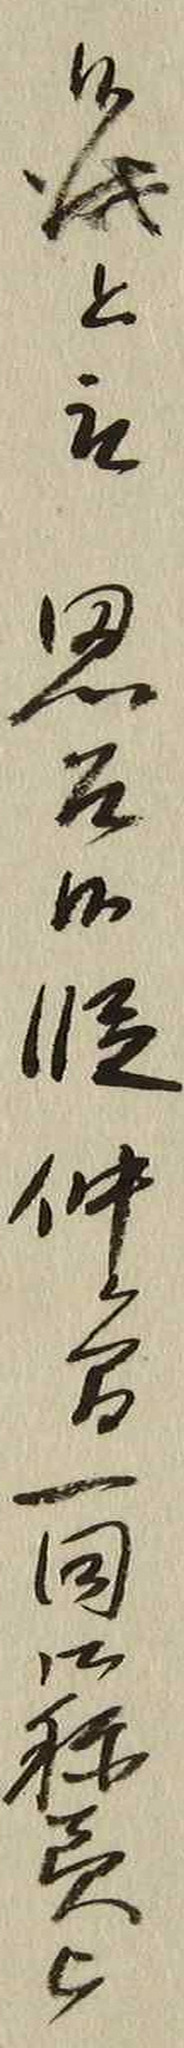候儀と被思召候段仲ヶ間一同御称美被
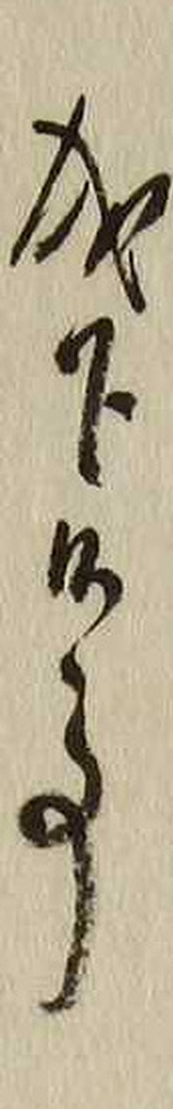成下候事
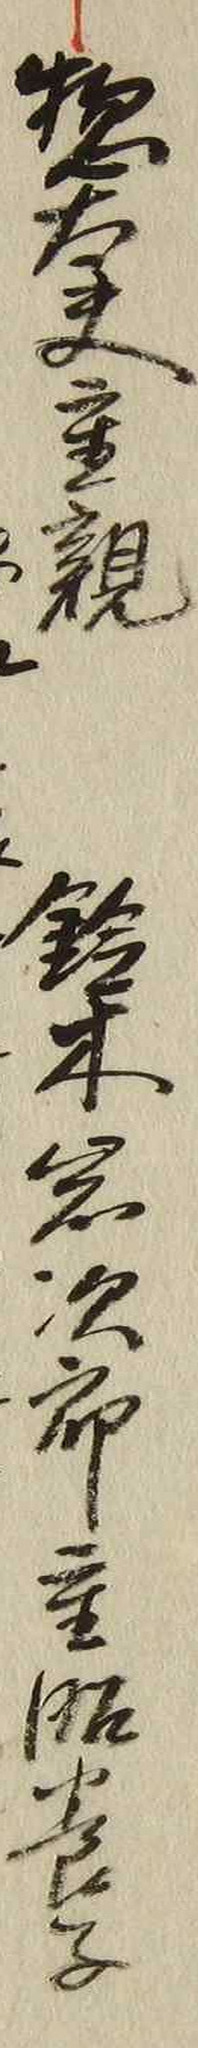惣太夫重親鈴木岩次郎重昭養子
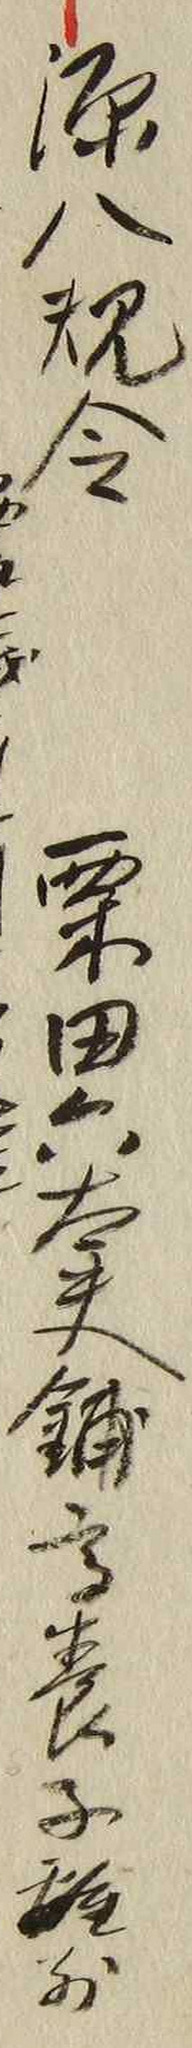源八規令栗田六太夫鋪高養子離別

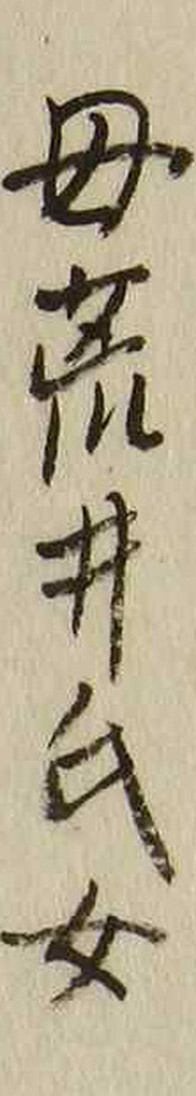母荒井氏女
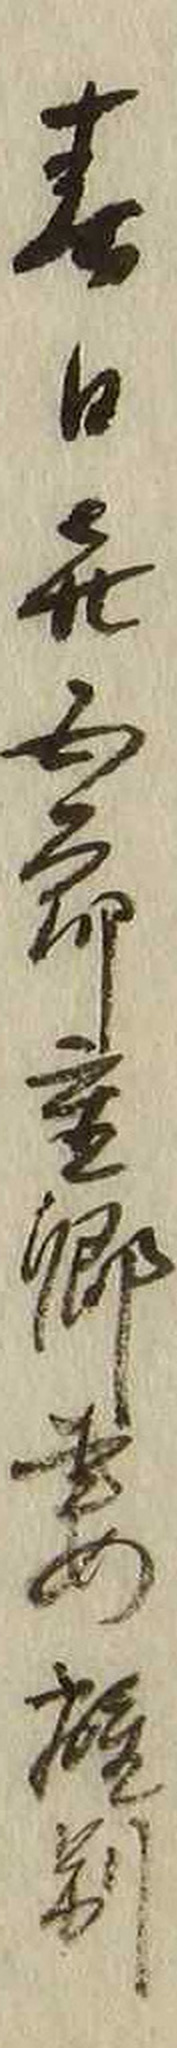春日喜五郎重郷妻離別
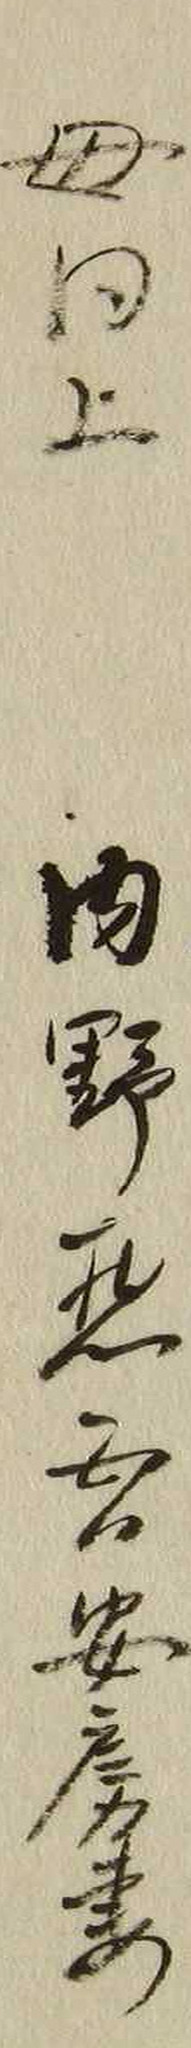母同上内野惣吾安房妻
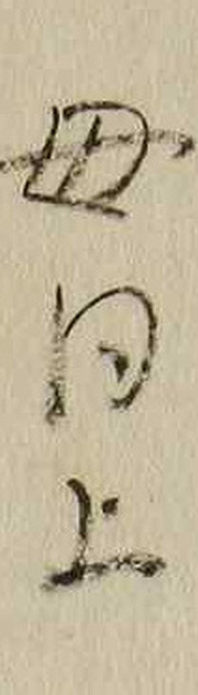母同上
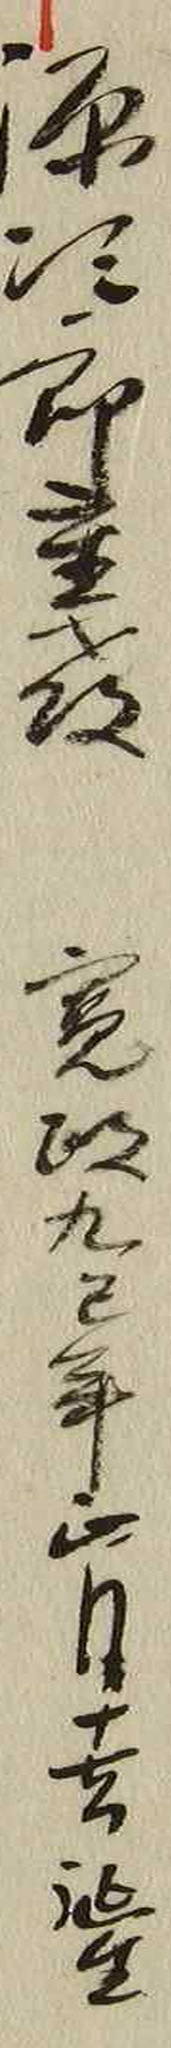源次郎重教寛坂九巳年正月十七日誕生
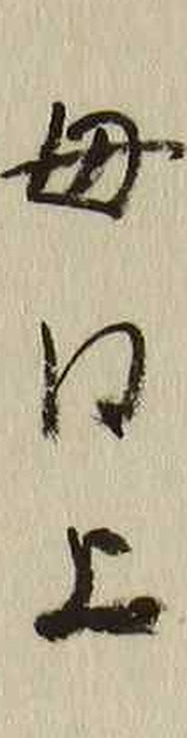母同上
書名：諸士系譜　巻之360　す之部10
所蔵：会津若松市立会津図書館
